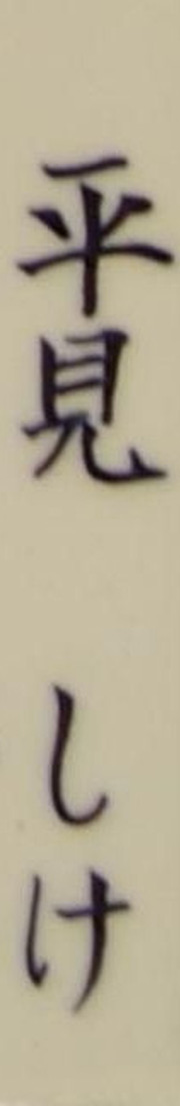平見しけ
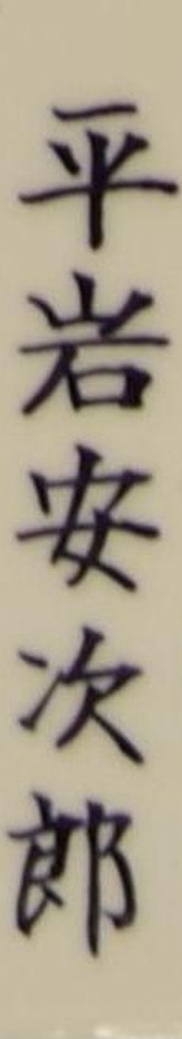平岩安次郎
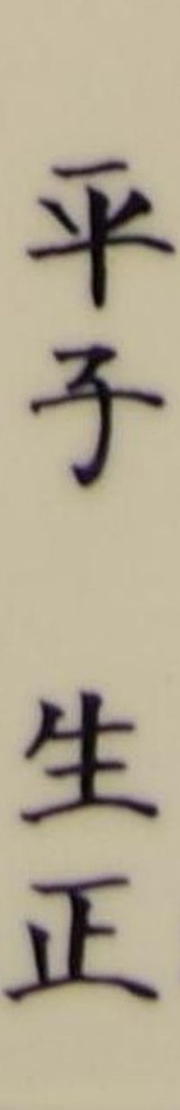平子生正
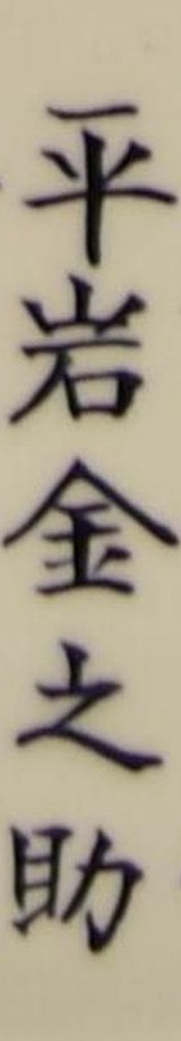平岩金之助
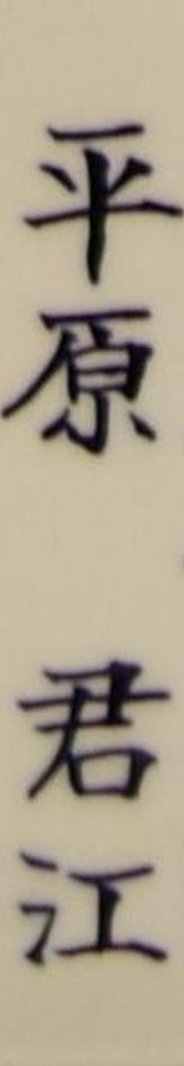平原君江
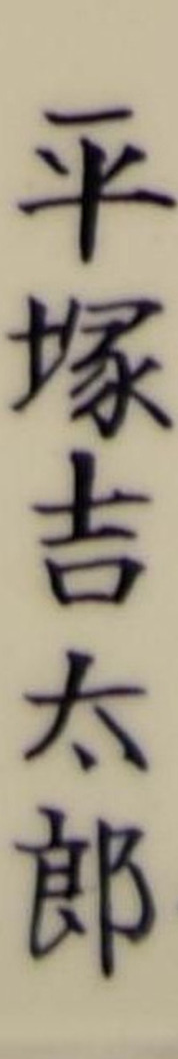平塚吉太郎
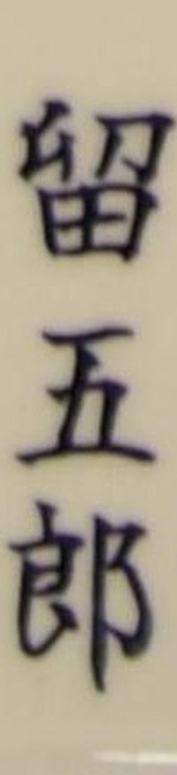留五郎
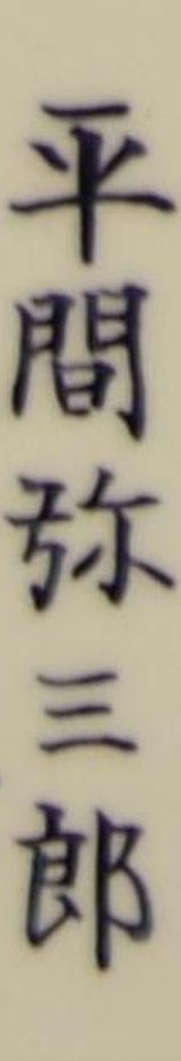平間弥三郎
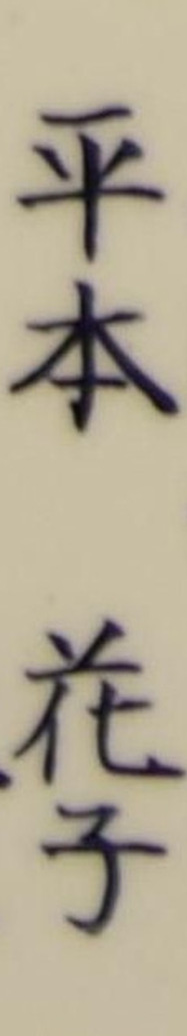平本花子
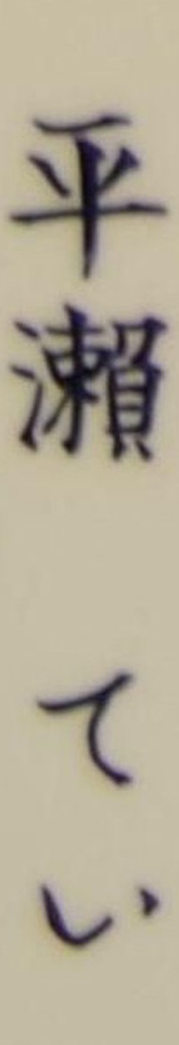平瀨てい
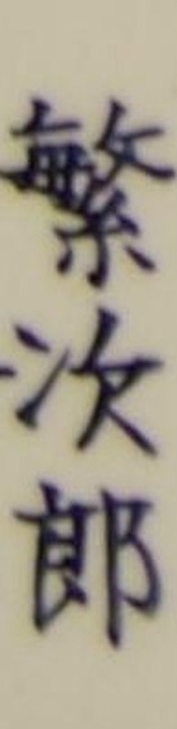繁次郎

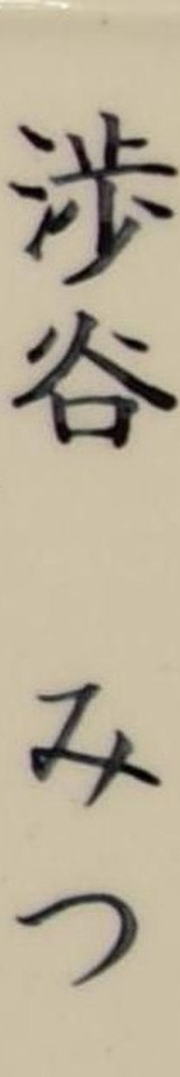渉谷みつ
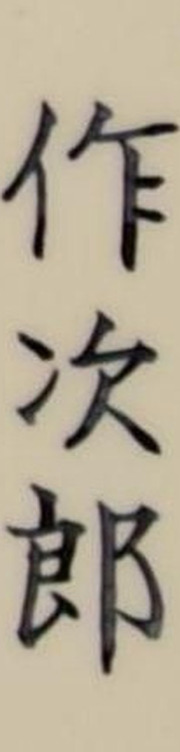作次郎
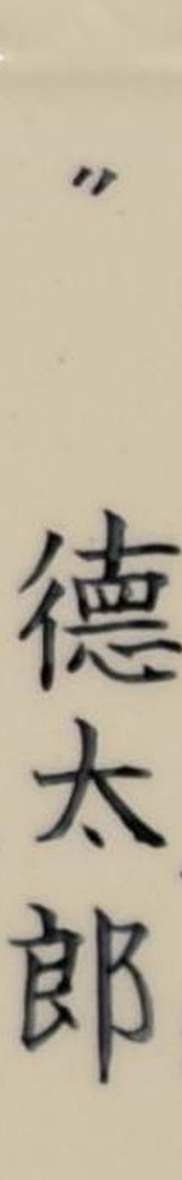徳太郎
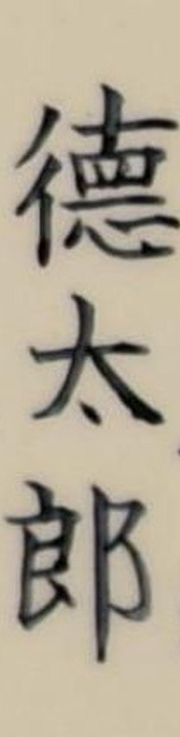徳太郎
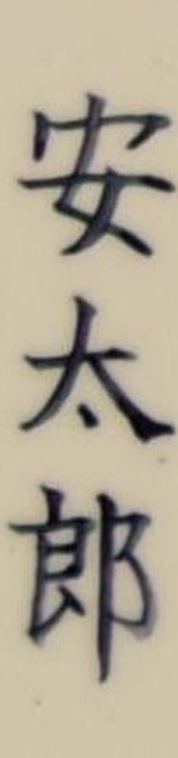安太郎
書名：A~D
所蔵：koyasan kongobuji
